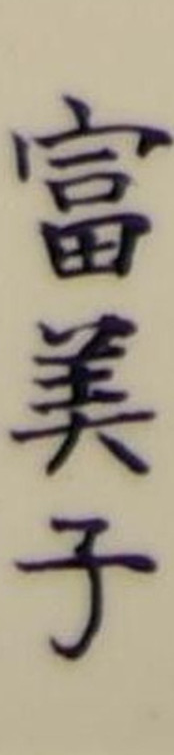富美子
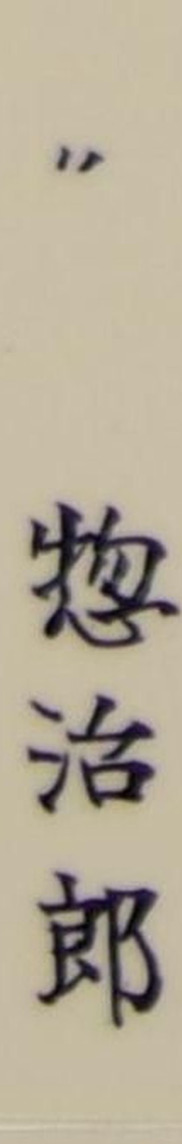惣治郎
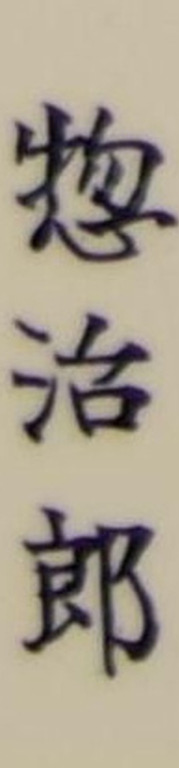惣治郎
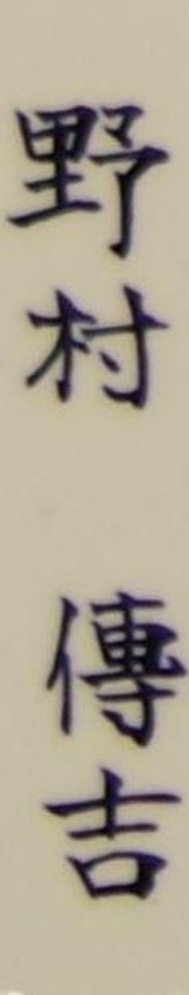野村傳吉
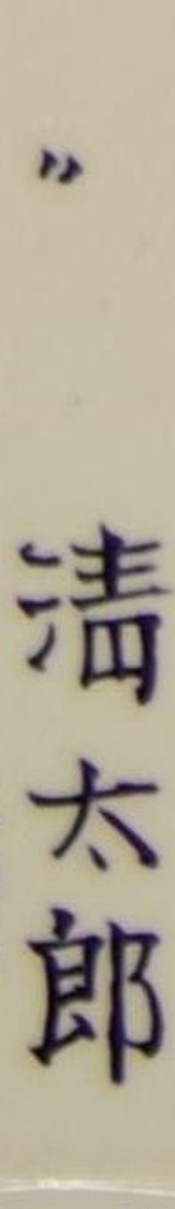清太郎
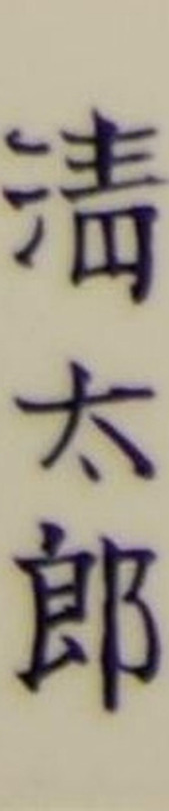清太郎

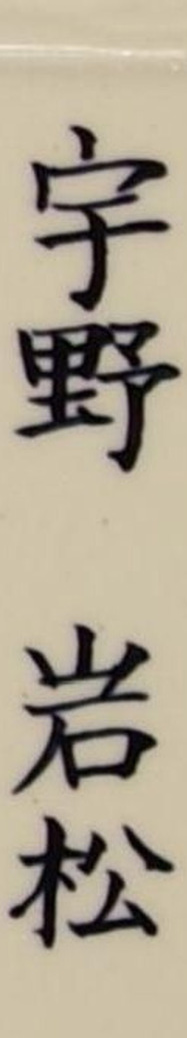宇野岩松
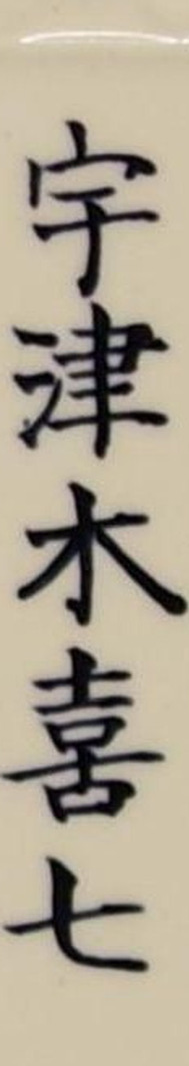宇津木喜七
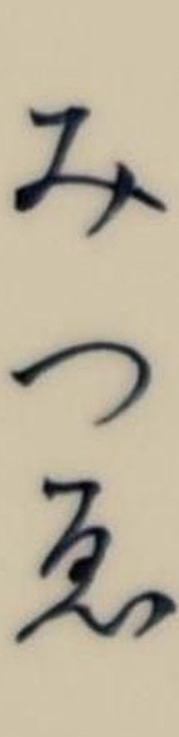みつゑ
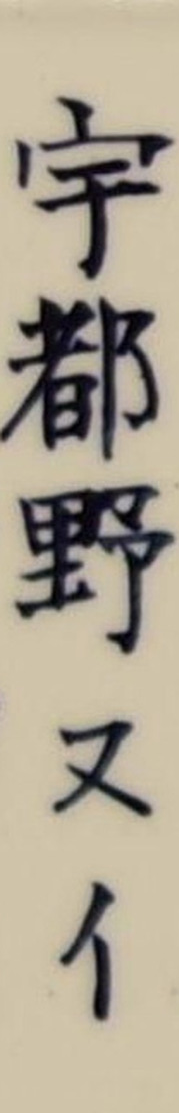宇都野ヌイ
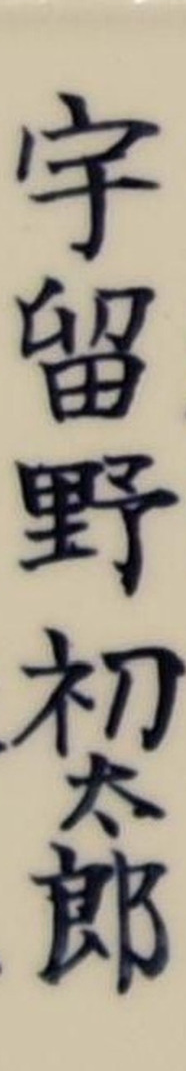宇留野初太郎
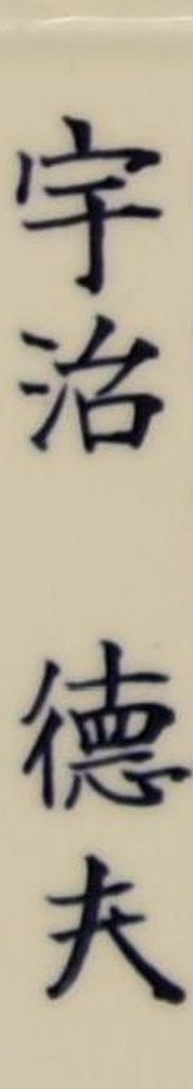宇治徳夫
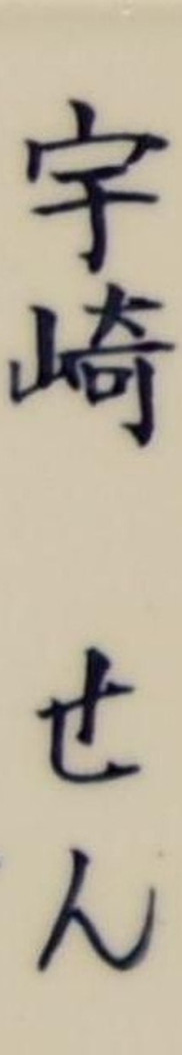宇崎せん
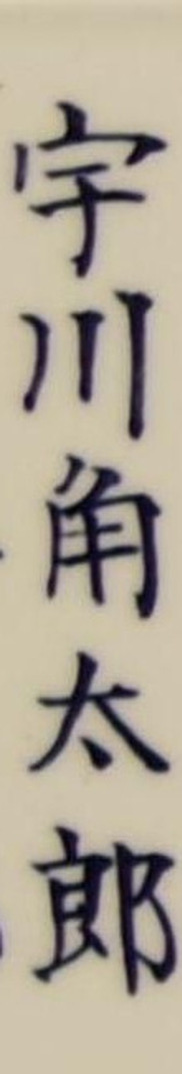宇川角太郎
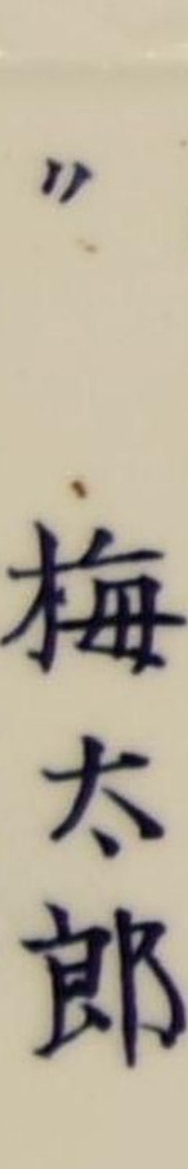梅太郎
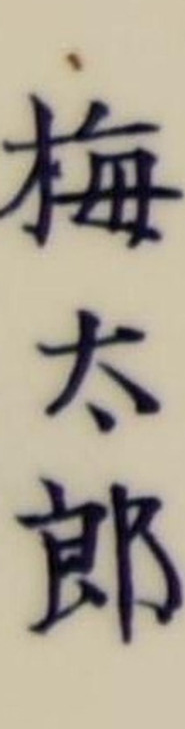梅太郎
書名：A~D
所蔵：koyasan kongobuji
